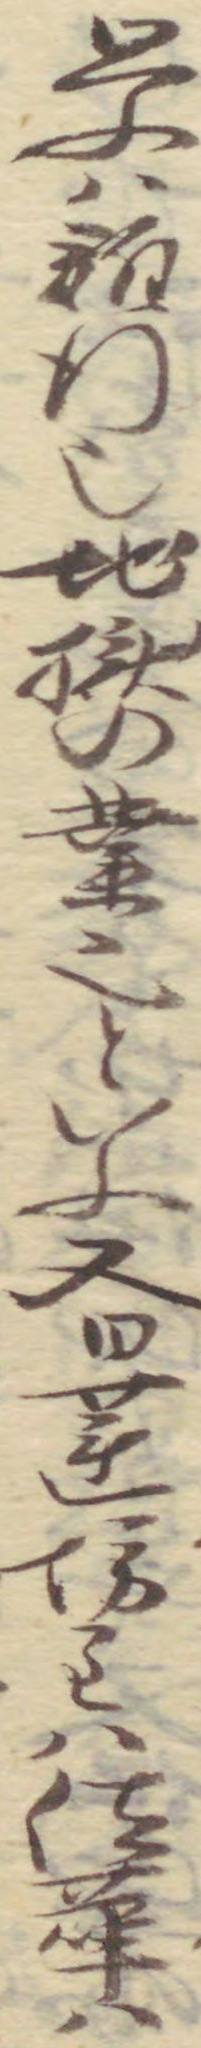思ふは難行也地獄の業也といふ又日蓮坊主は法華は
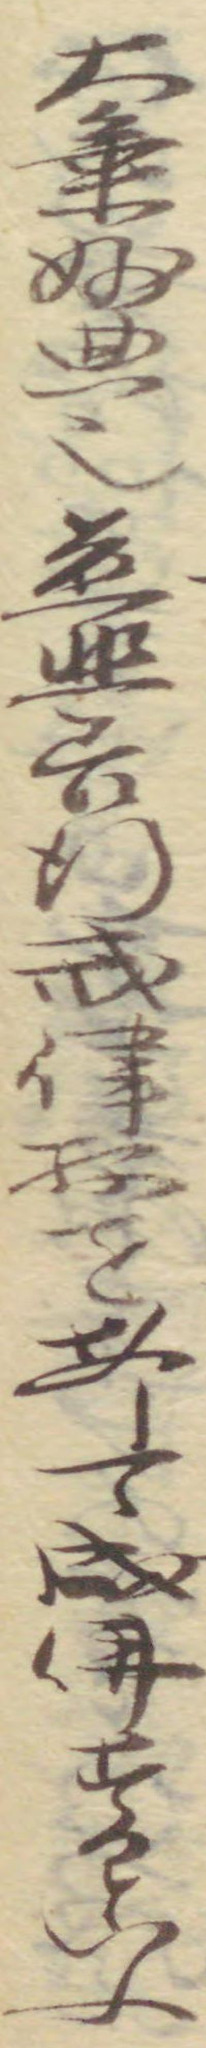大乗妙典也慈悲善行戒律抔をなして成仏するといふ
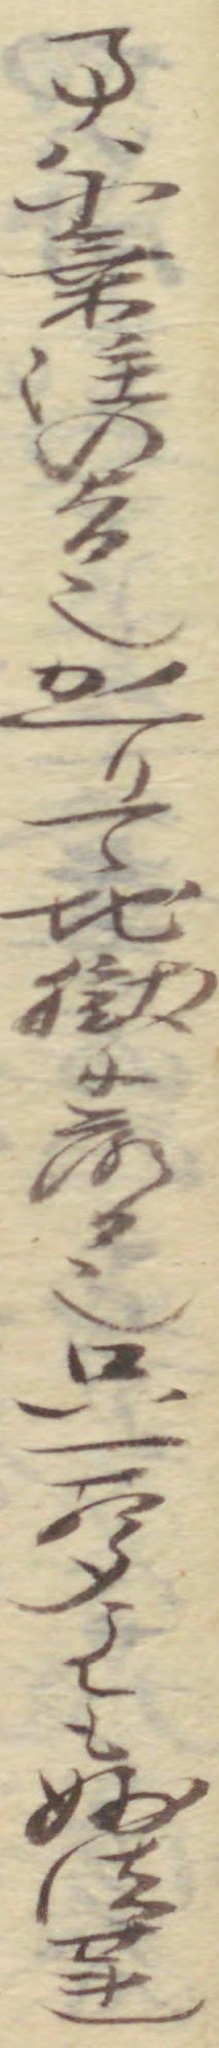事は小乗注の旨也かへりて地獄に落る也只一声ニても妙法蓮
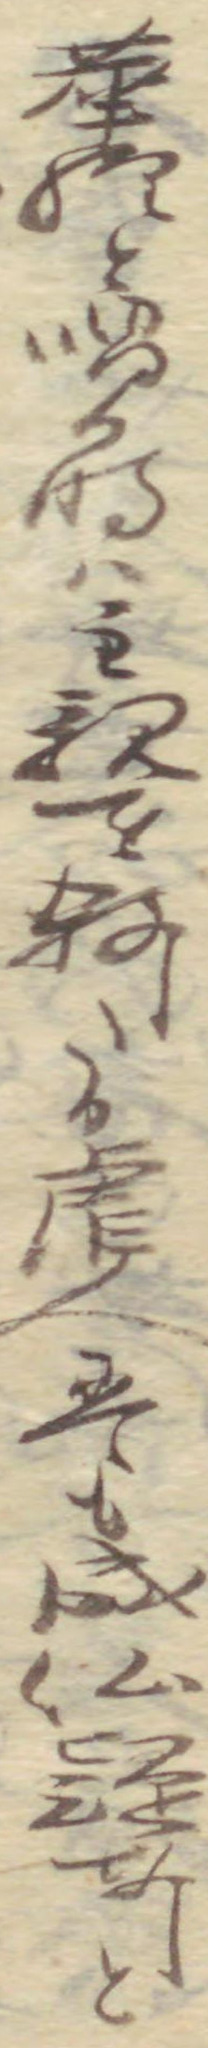華経と唱る時は主親を殺したる虐人にても成仏疑なしと
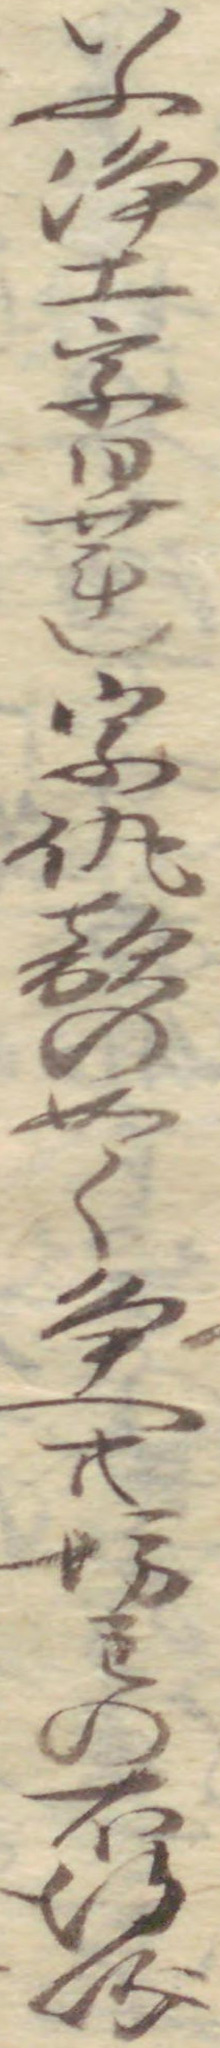いふ浄土宗日蓮宗仇敵の如く争へ共坊主の不埒儀
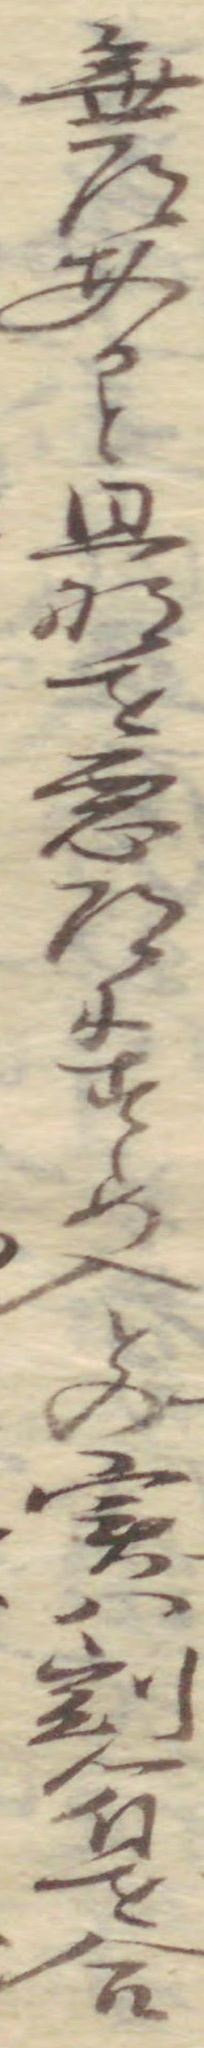無道なると旦那を悪道にすゝめ入との実は割符を合
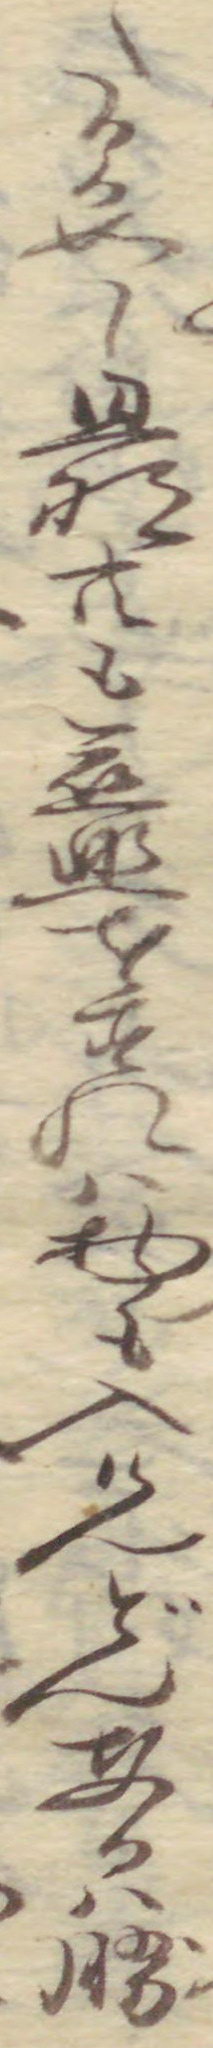たるかごとし旦那共も慈悲をすれは物も入けんどんなるは勝
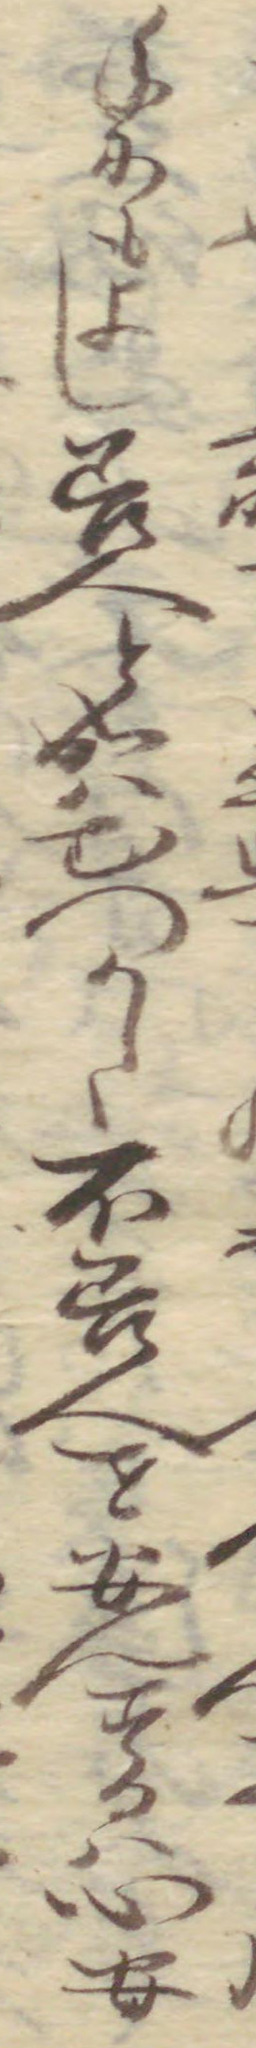手にもよし善人と成はむつかしく不善人を安んするは心安
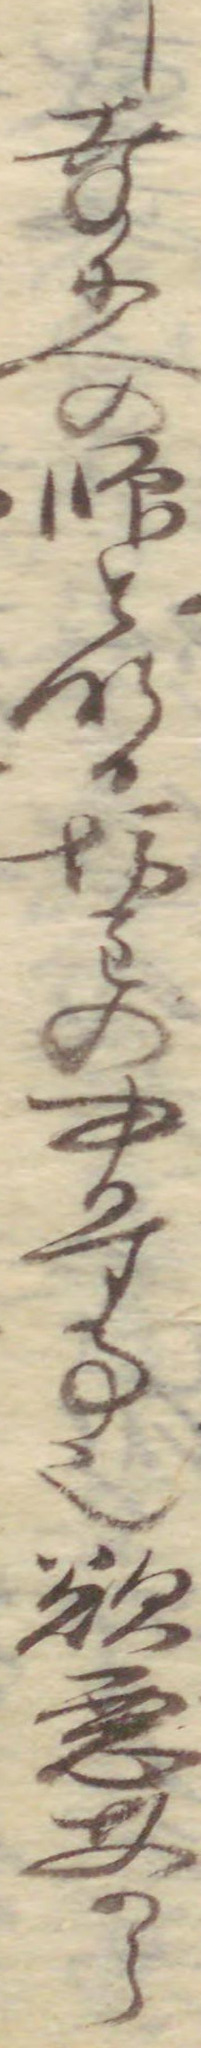し幸に人の師となる坊主のゆるす事也欲悪なから
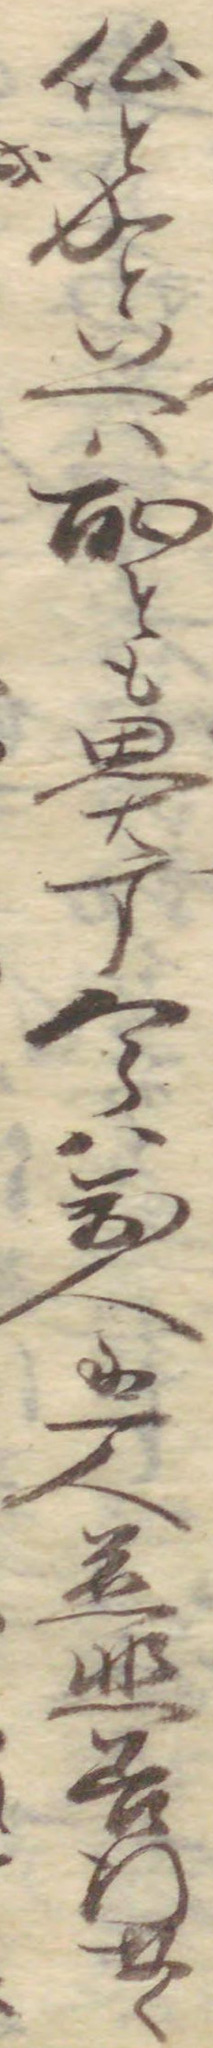仏と成といへは恥とも思はす今は万人に一人慈悲善行なく
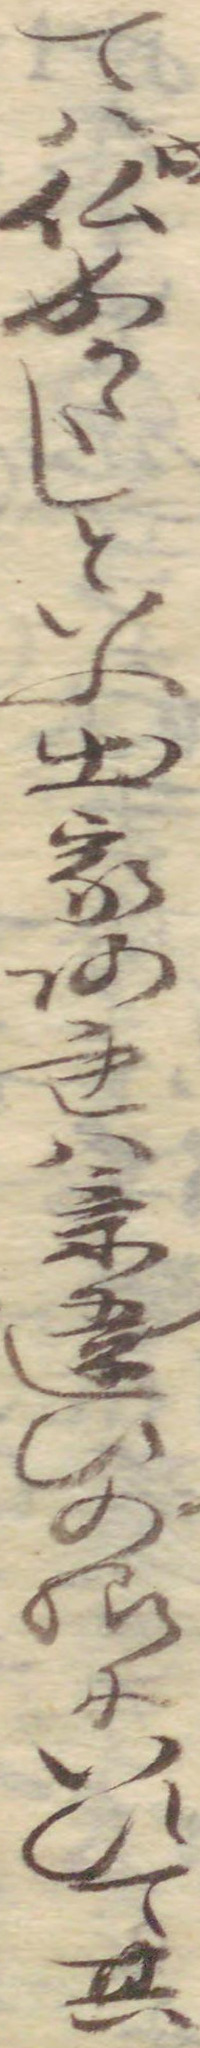ては成仏かたしといふ出家あれは気違ひの様にいひて其
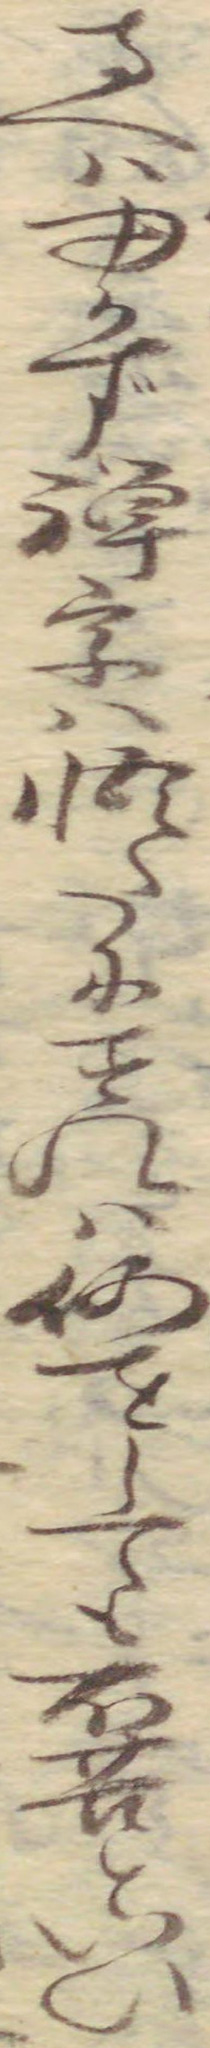寺へはゆかず禅宗は悟たにすれは何をしても不苦といひ
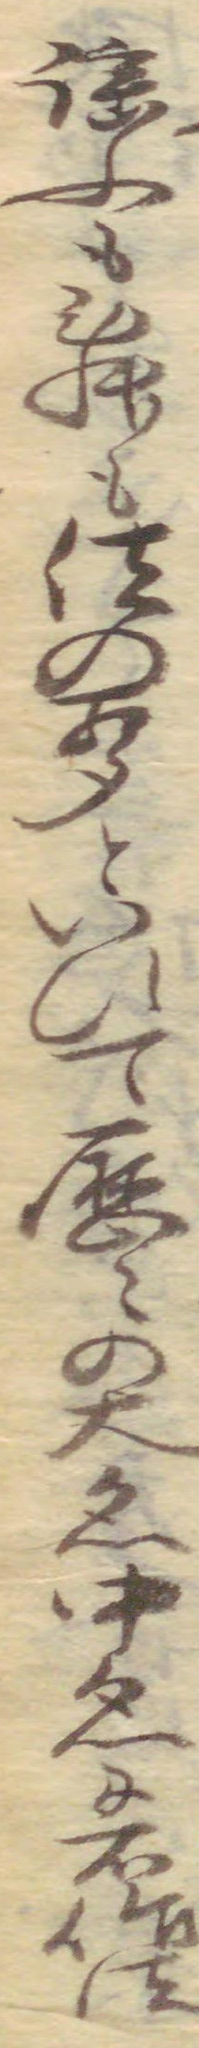謡ふも舞も法の声といひて歴〻の大名中名に不作法

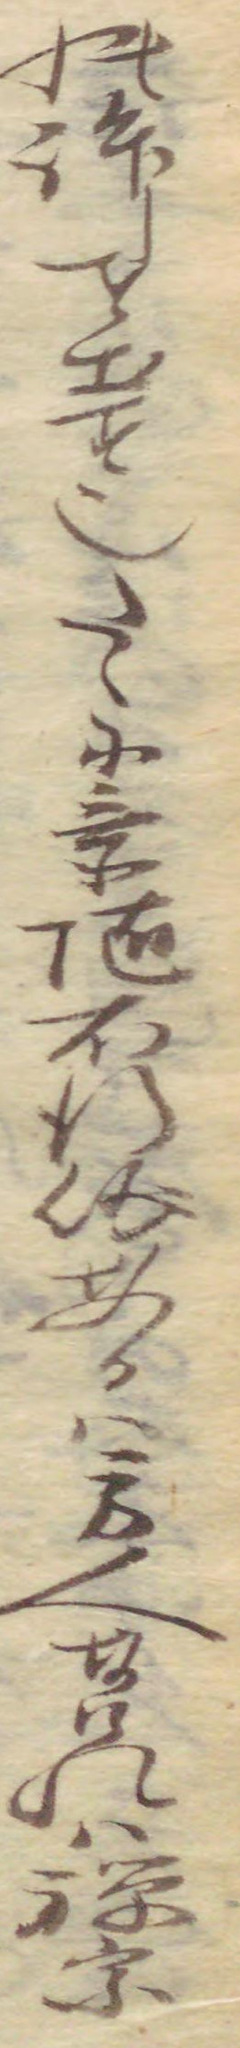の許しを出す也たゝに気随不行義なるは方人なけれは禅宗
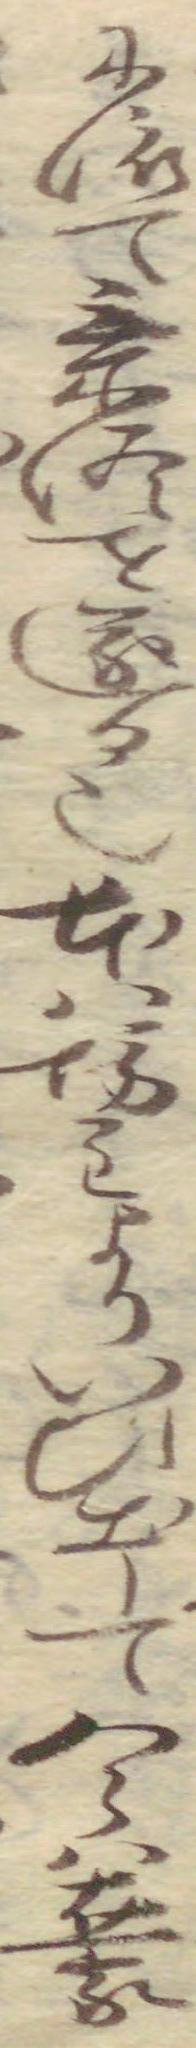に依て気侭を遂る也本は坊主よりいひ出して今は在家
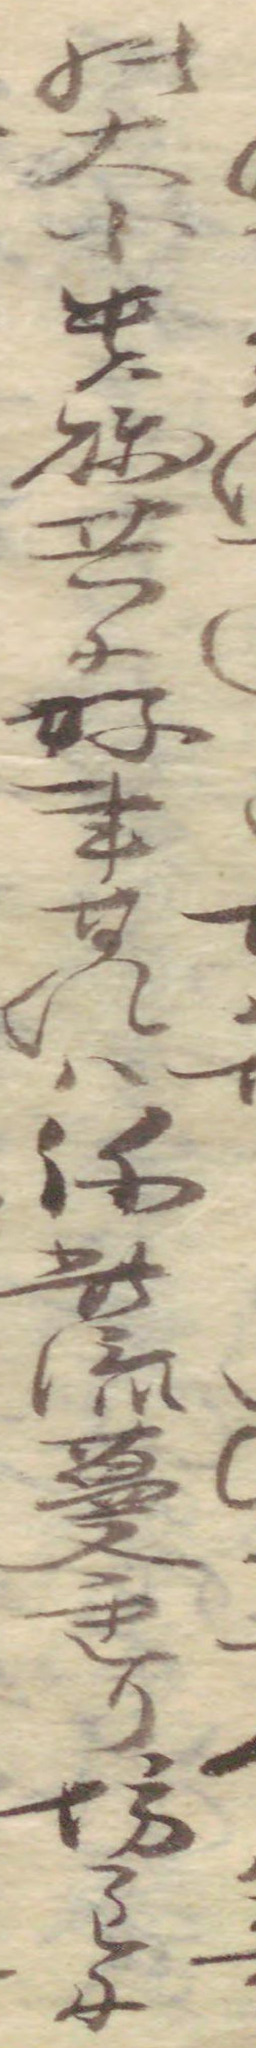の大小貴賎共に好事なれは弥此流蔓れり坊主に
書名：鶯宿雑記. 巻263-264
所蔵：国立国会図書館 National Diet Library, JAPAN
